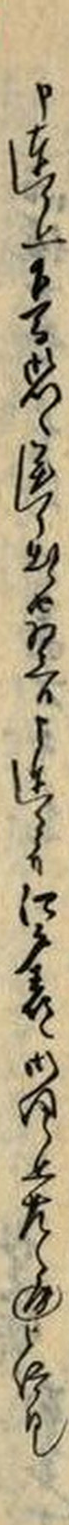申達候上下馬御門へ送り出候由翌日申達候ニ付江戸表へ御伺之上左之通被仰付候

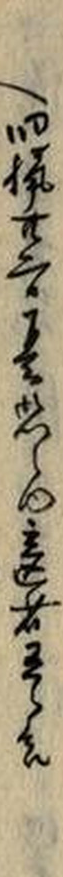旧蝋廿二日下馬御門之内立込者有之節
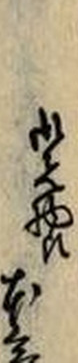御先物頭
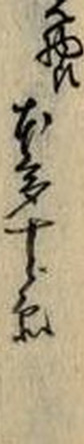本多十郎兵衛
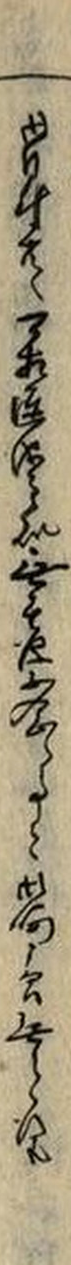御目付共へ可相達儀ニ候処無其儀不念之事ニ候御呵候而ハ無之候得共
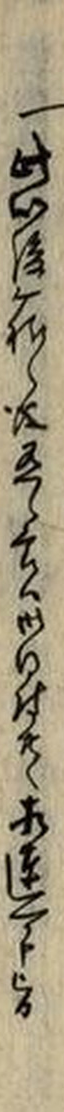此以後ヶ様之儀有之節ハ御目付共へ相達可申旨
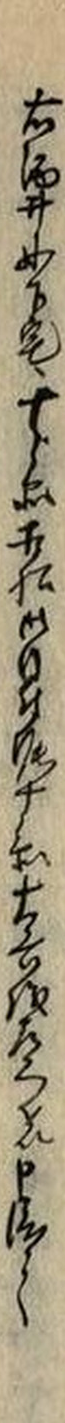右酒井丹下宅へ十郎兵衛相招御目付堀十兵衛大谷儀左衛門を以申渡之
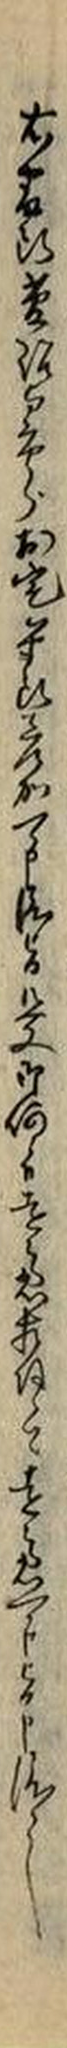右番頭菅沼与市郎於宅筆頭差加可申渡旨且又御呵候付遠慮相伺候ハヽ遠慮可申旨申渡之
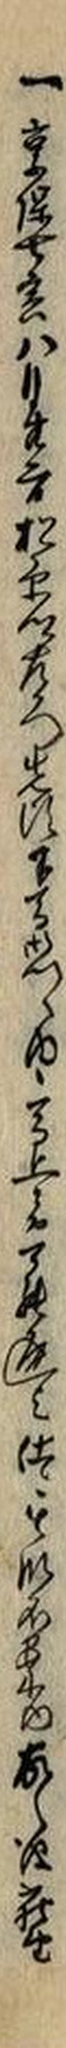一享保七寅八月廿二日松原郷左衛門先頃下馬御門之内へ馬上ニ而可罷通与仕候其段不案内故之儀荻野
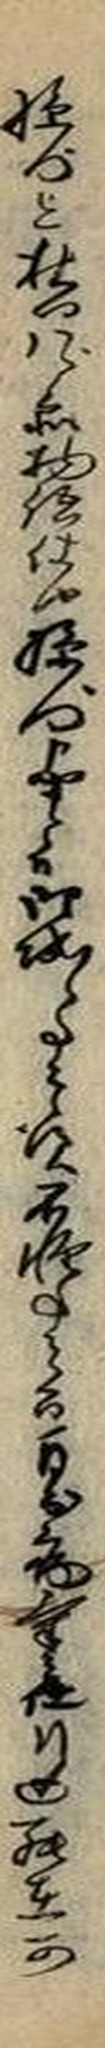孫右衛門迄秋田八郎兵衛物語仕候孫右衛門申聞候ニ付御城之事ニ候得ハ不軽事ニ候間自分病気ニ仕引込罷在可
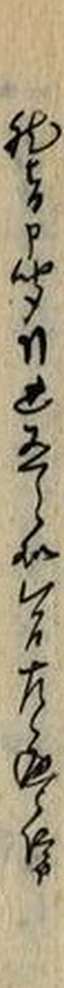然旨申聞引込有之候処今日左之通被仰付
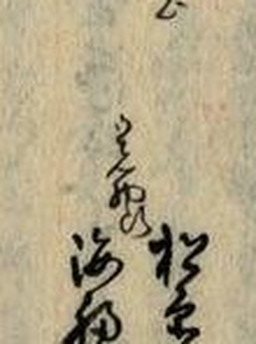御先物頭
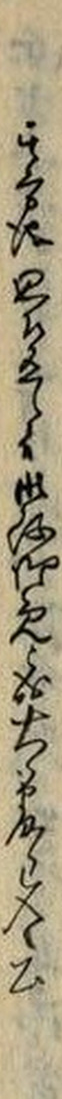其方儀思召有之候ニ付御役御免被成大御番被入候以上
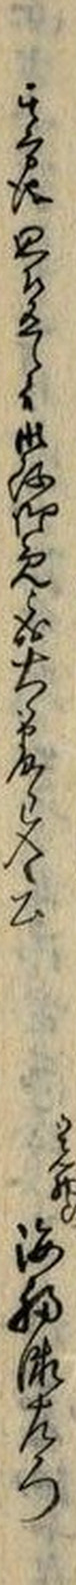其方儀思召有之候ニ付御役御免被成大御番被入候以上
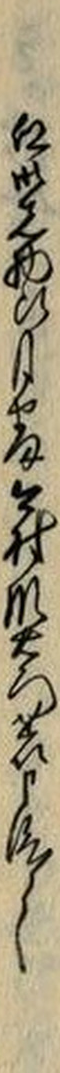但御先物頭月番今村段右衛門を以申渡之
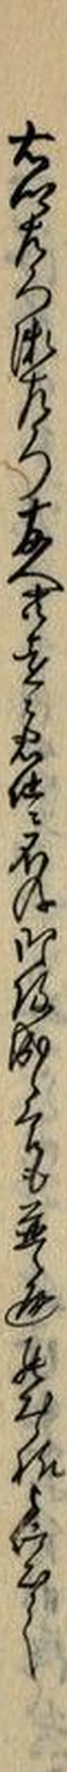右郷左衛門瀬左衛門両人共遠慮仕ニ不及御帰城之節も並之通罷出候様仰出之
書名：御門御櫓之部
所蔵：福井県文書館 Fukui Prefectural Archives
